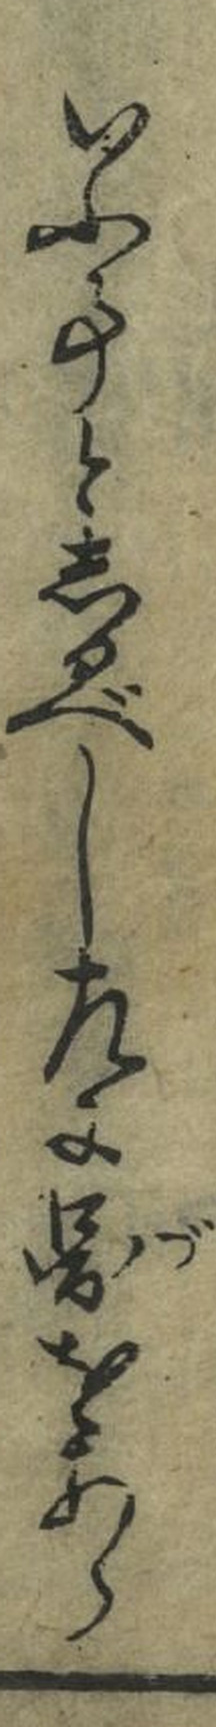いふ事としるべし左に図をあら

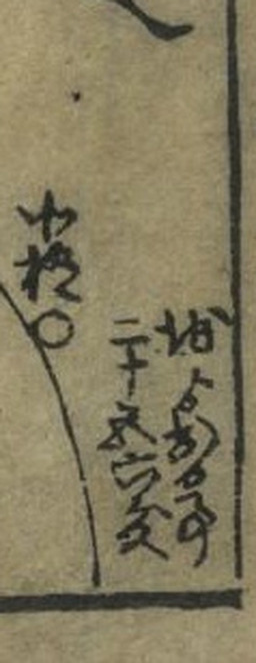二十五六度
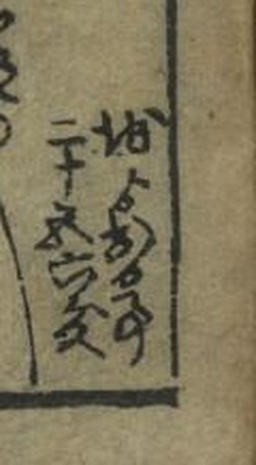地ゟ出る事
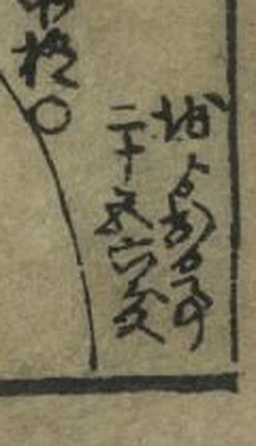二十五六度
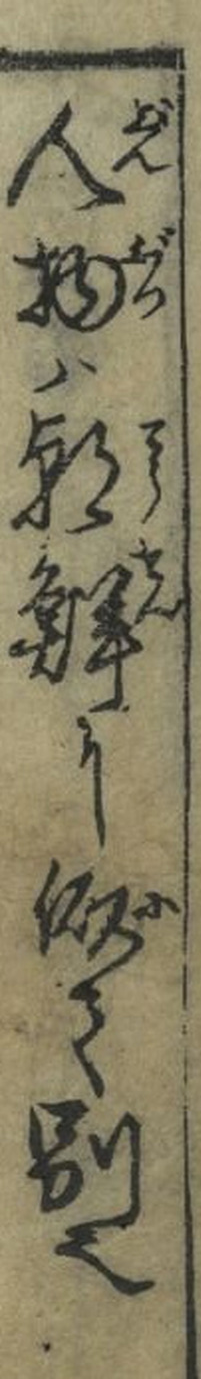人物は朝鮮に似て別也
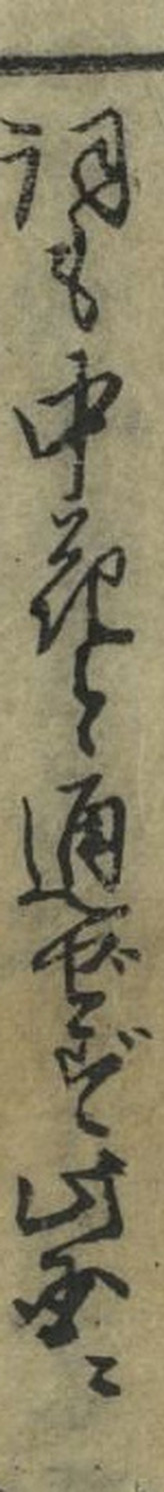詞も中花と通ぜず此国に
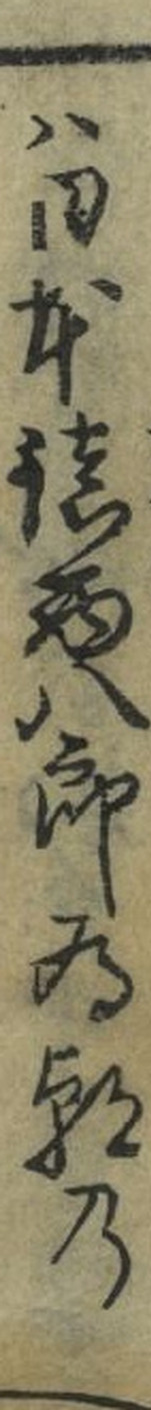は日本鎮西八郎為朝の
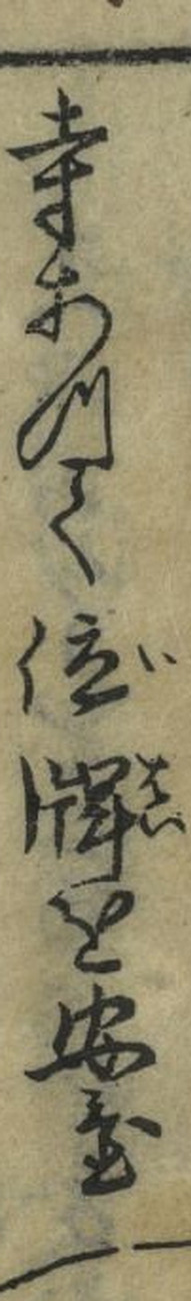寺あつく位牌を安置
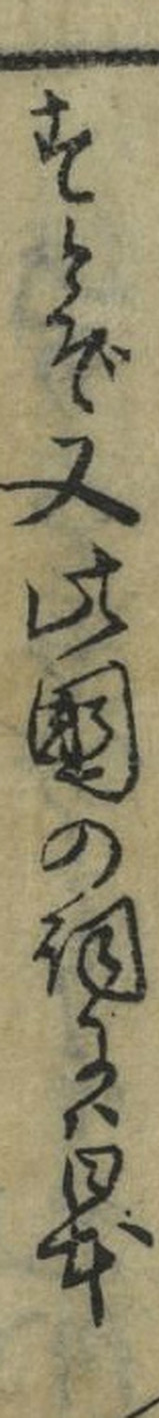すとぞ又此国の詞には日本
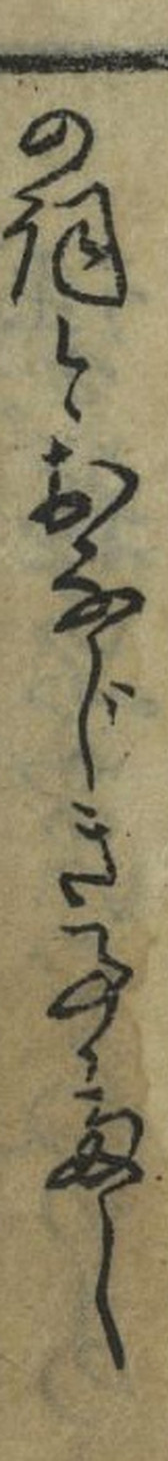の詞とおなじき事多し
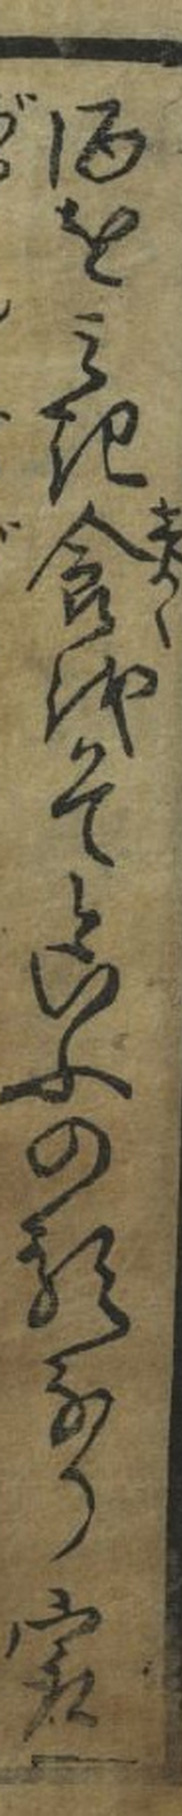酒をみき食をそといふの類なり最
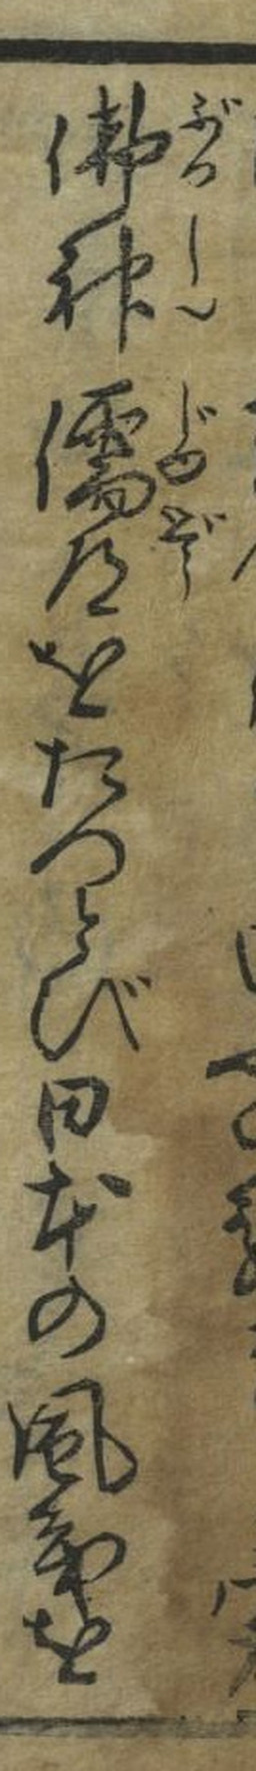仏神儒道をたつとび日本の風義を
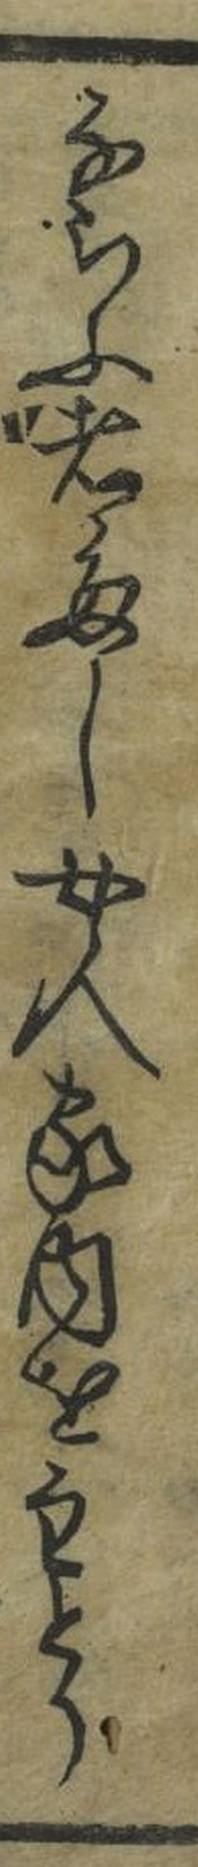ならふ者多し女人家内を主とり
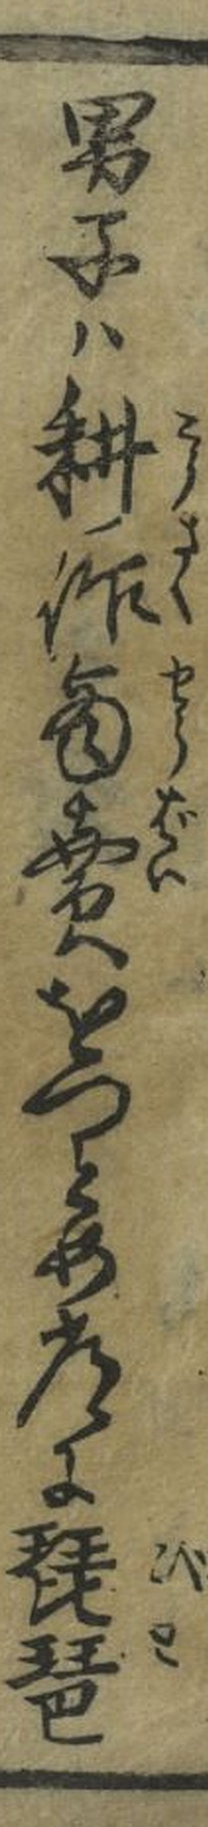男子は耕作商売をつとめ常に琵琶
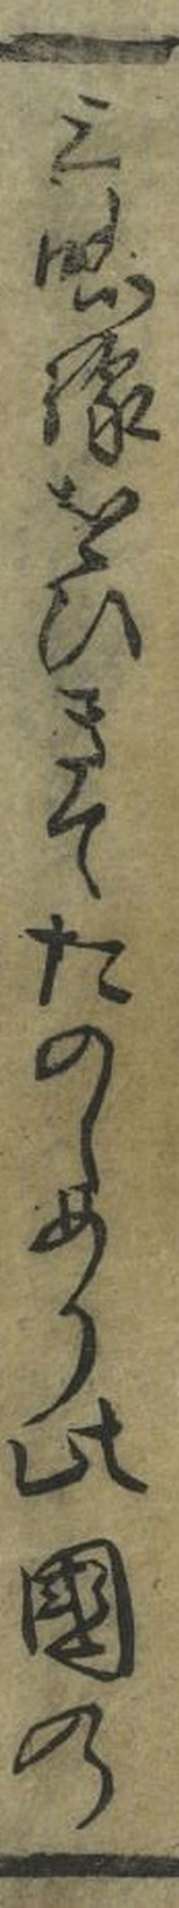三味線をひきてたのしめり此国の
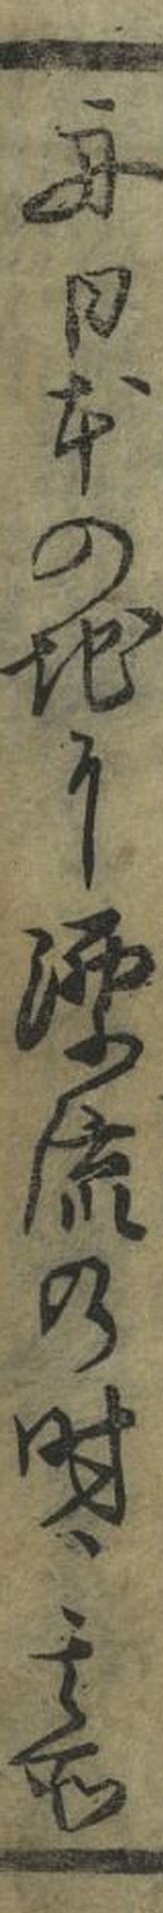舟日本の地に漂流の時其所
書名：琉球雑話
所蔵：University of the Ryukyus Library
